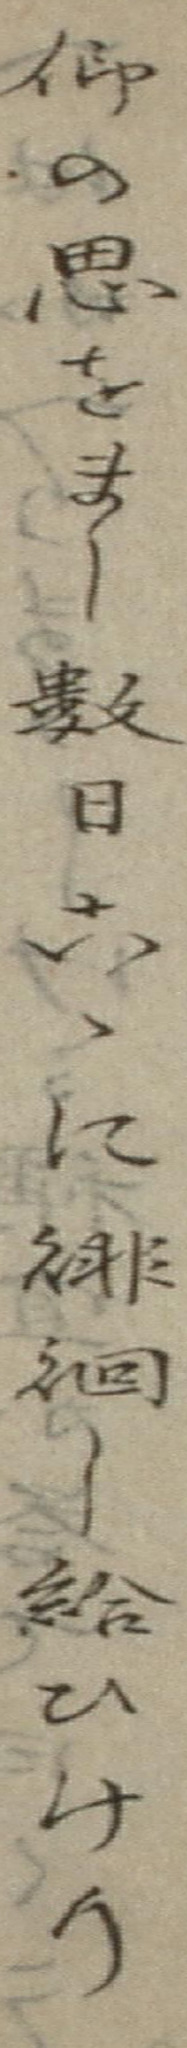仰の思をまし数日こゝに徘徊し給ひけり
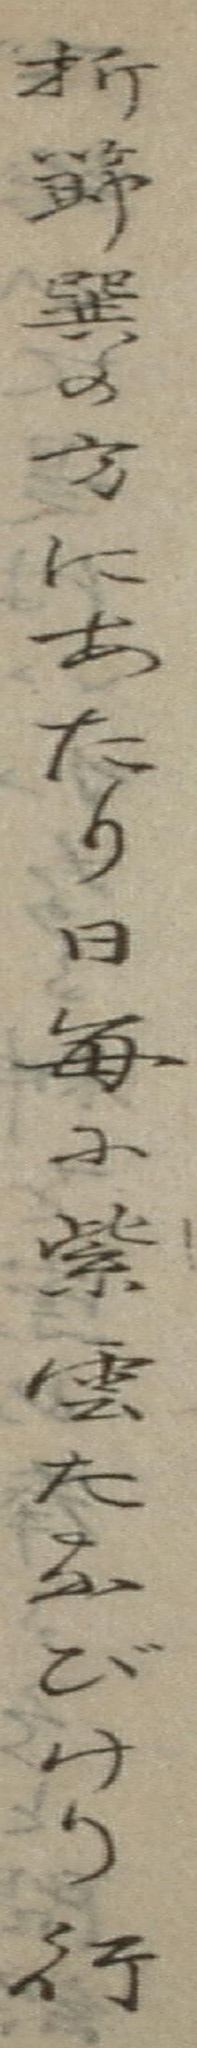折節巽の方にあたり日毎に紫雲たなびけり行
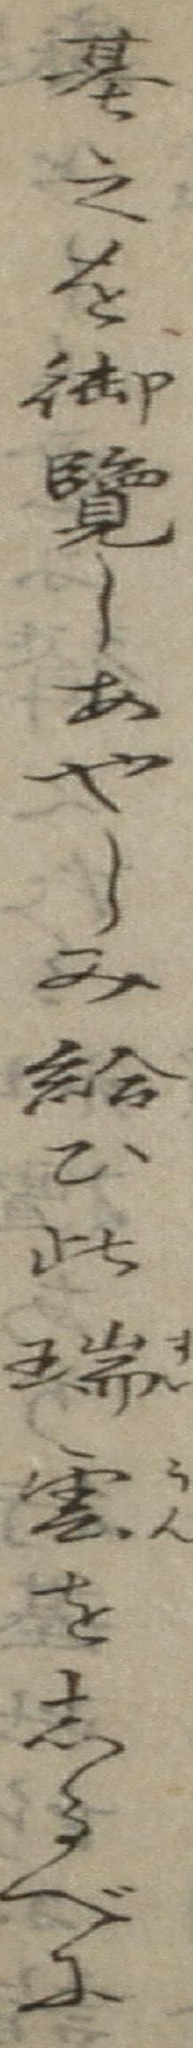基之を御覧しあやしみ給ひ此瑞雲をしるべに
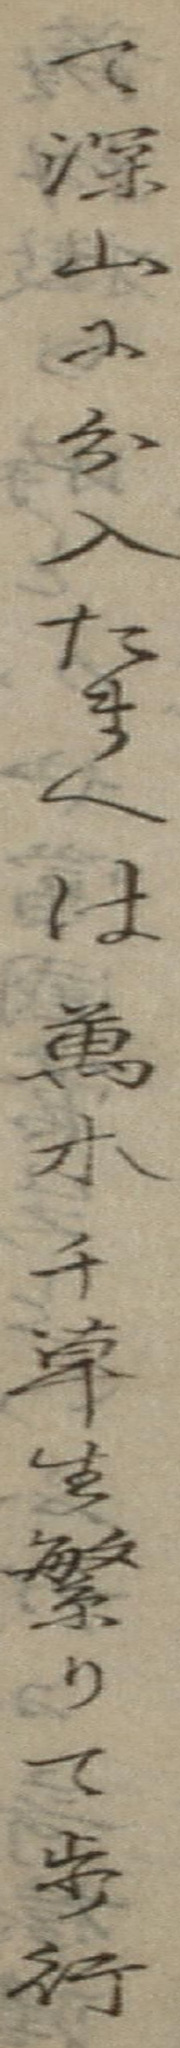て深山に分入たまへは万木千草生繁りて歩行
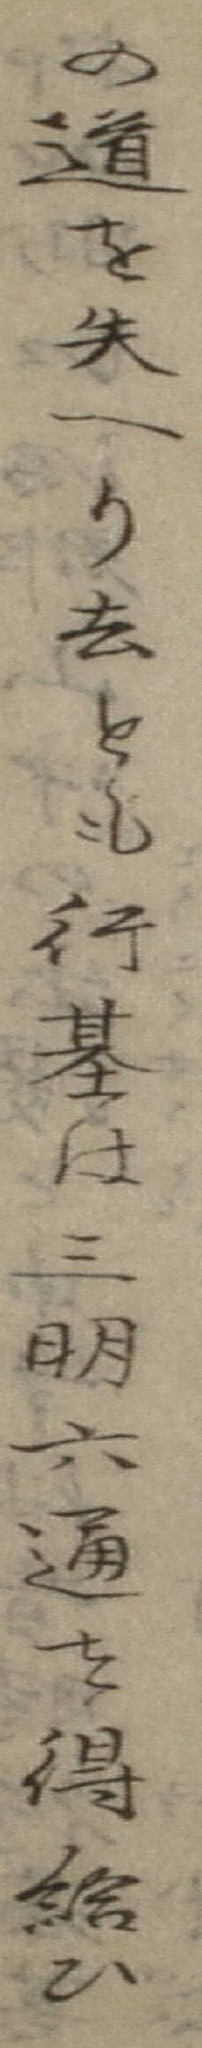の道を失へり去とも行基は三明六通を得給ひ
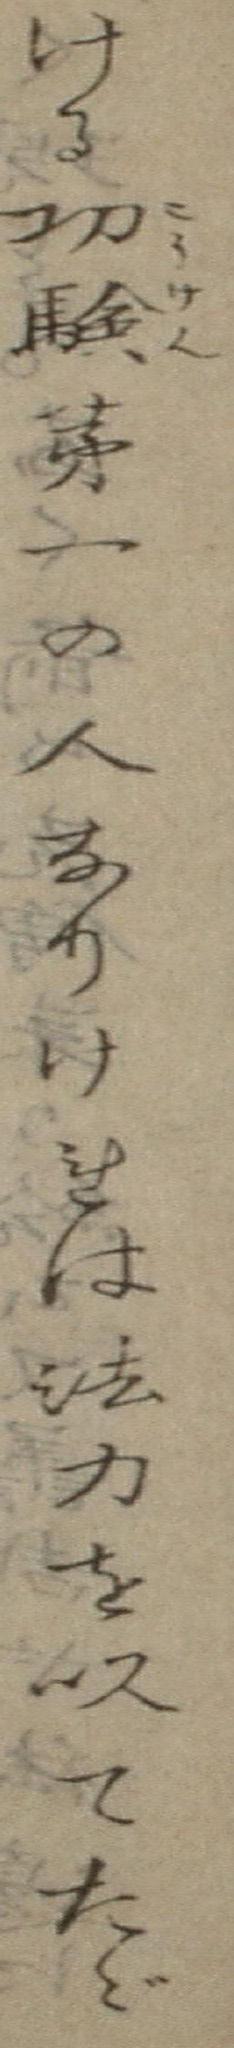ける功験第一の人なりけれは法力を以てたゞ
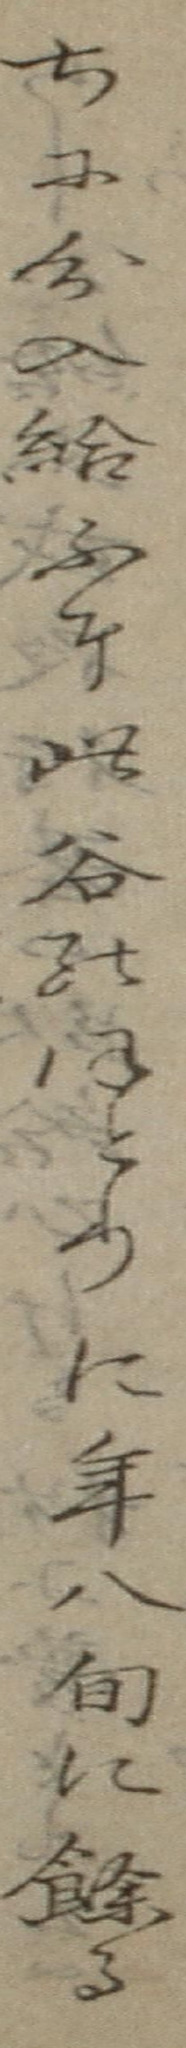ちに分入給ふに此谷のほとりに年八旬に余る
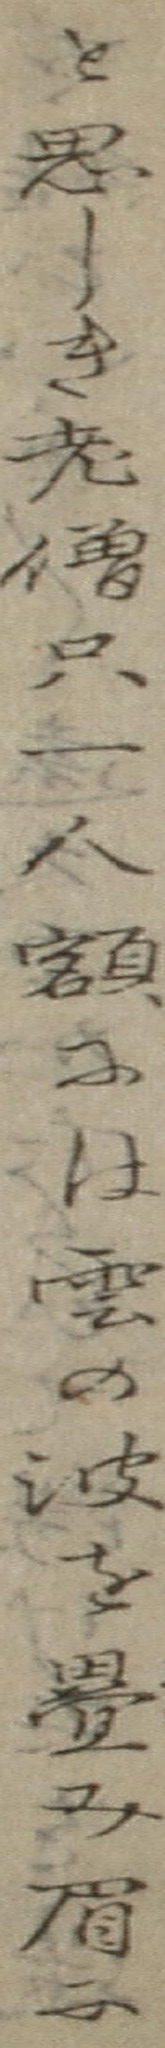と思しき老僧只一人額には雲の波を畳み眉に
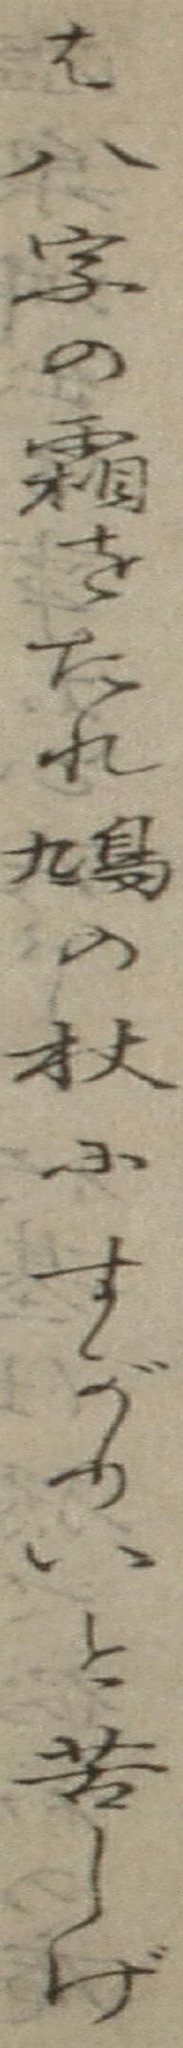は八字の霜をたれ鳩の杖にすがりいと苦しげ
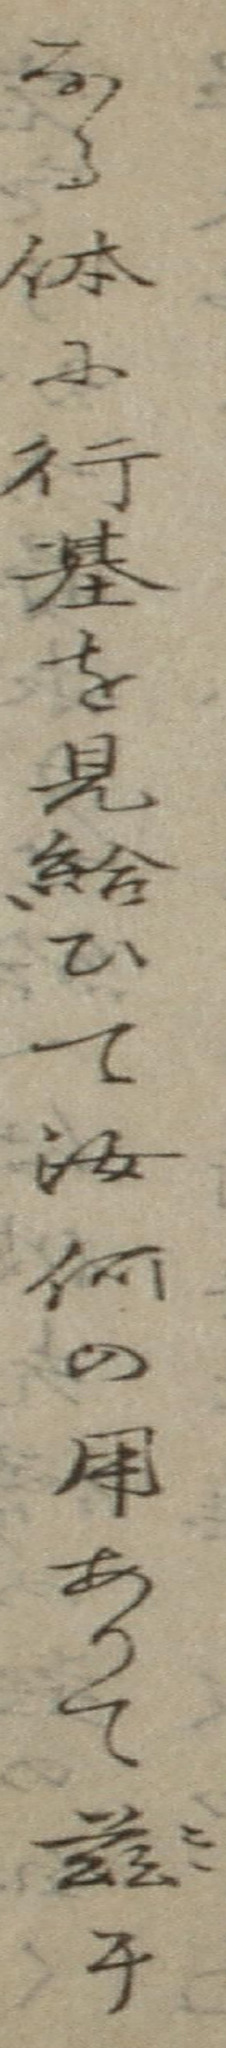なる体に行基を見給ひて汝何の用ありて茲に
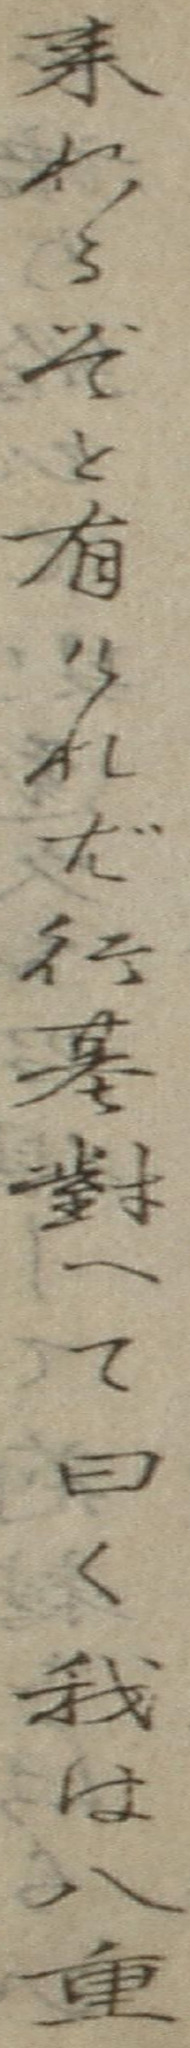来れるぞと有ければ行基対へて曰く我は八重
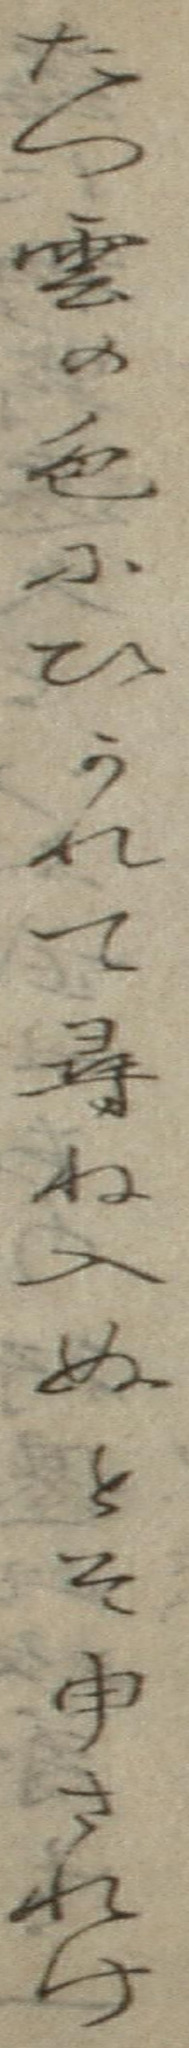たつ雲の色にひかれて尋ね入ぬとそ申されけ
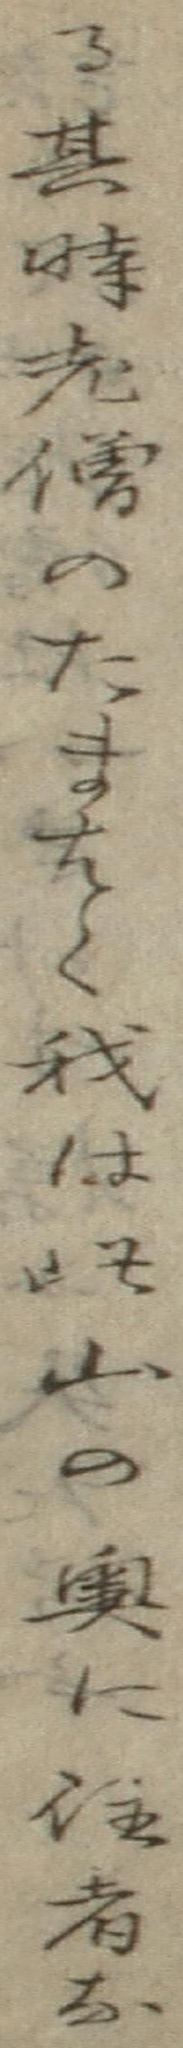る其時老僧のたまはく我は此山の奥に住者な
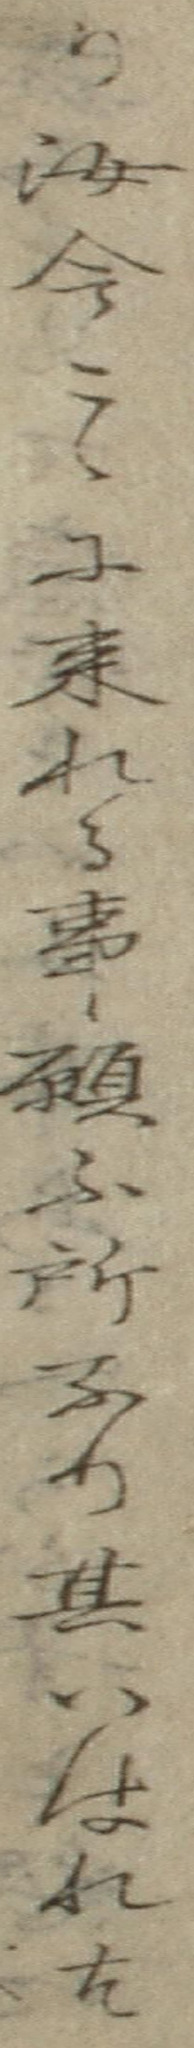り汝今こゝに来れる事願ふ所なり其いはれは
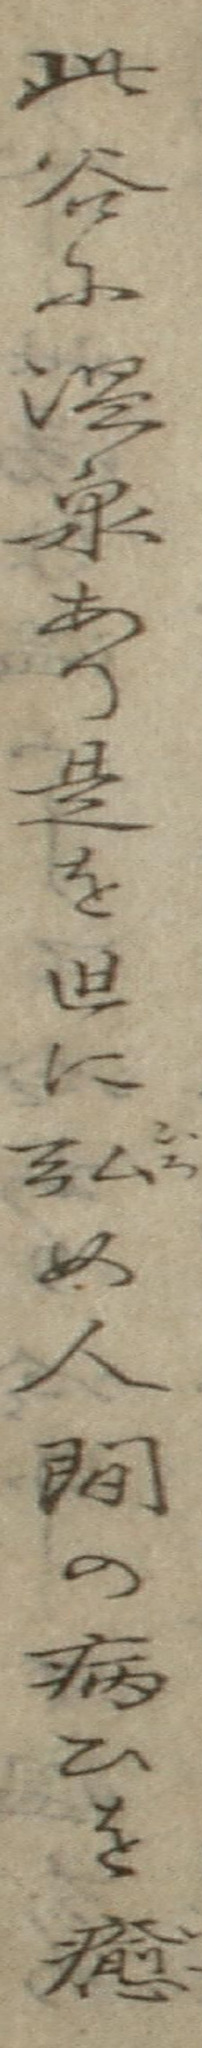此谷に温泉あり是を世に弘め人間の病ひを癒

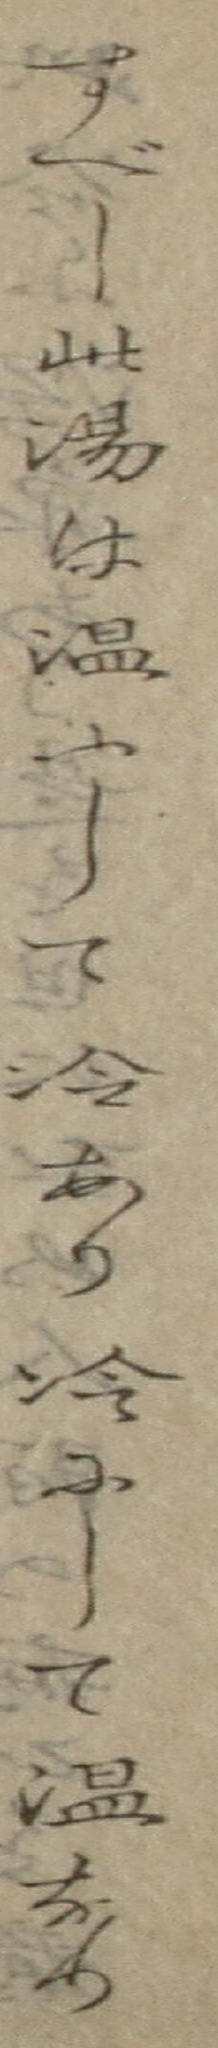すべし此湯は温にして冷あり冷にして温なり
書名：山中温泉縁記并ニ入浴之心得
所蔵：東京大学地震研究所図書室 Earthquake Research Institute Library, The University of Tokyo, JAPAN
